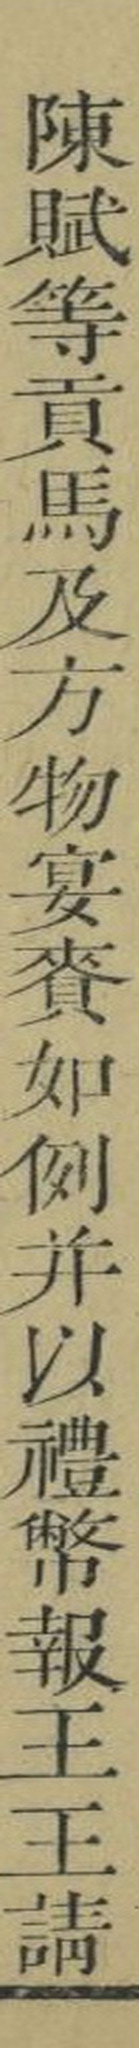陳賦等貢馬及方物宴賚如例并以礼幣報王王請
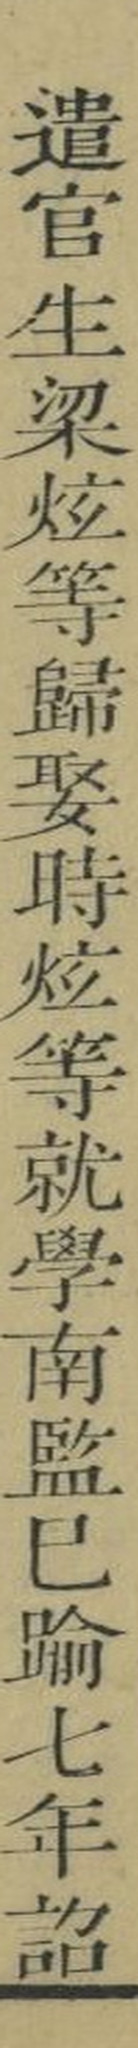遣官生梁炫等帰娶時炫等就学南監巳踰七年詔
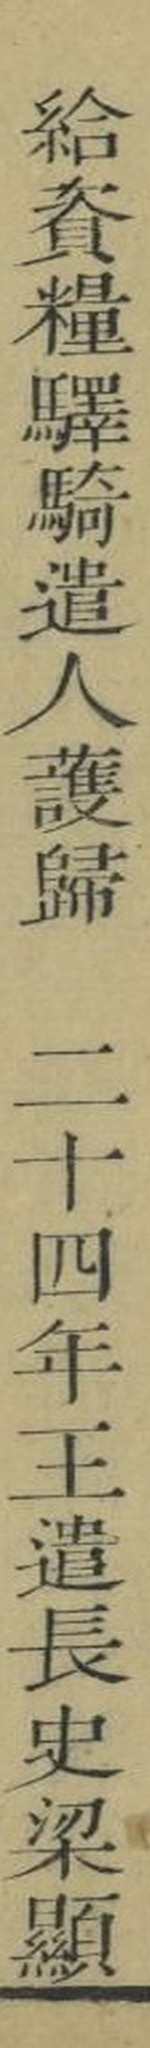給資糧駅騎遣人護帰二十四年王遣長史梁顕
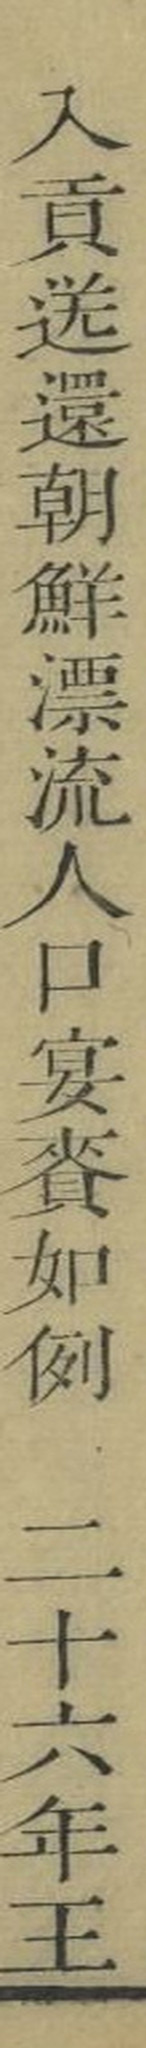入貢送還朝鮮漂流人口宴賚如例二十六年王
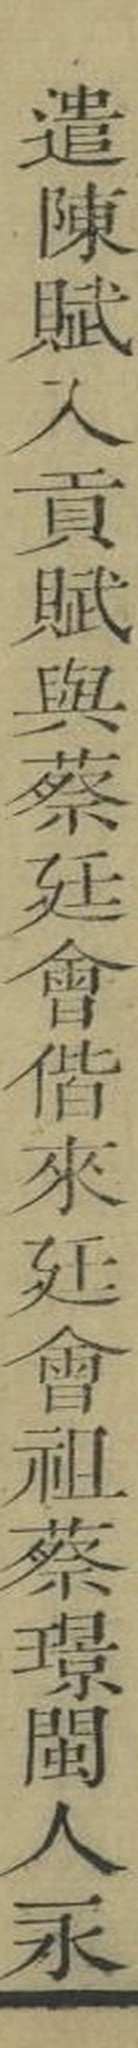遣陳賦入貢賦与蔡廷会偕来廷会祖蔡璟閩人永
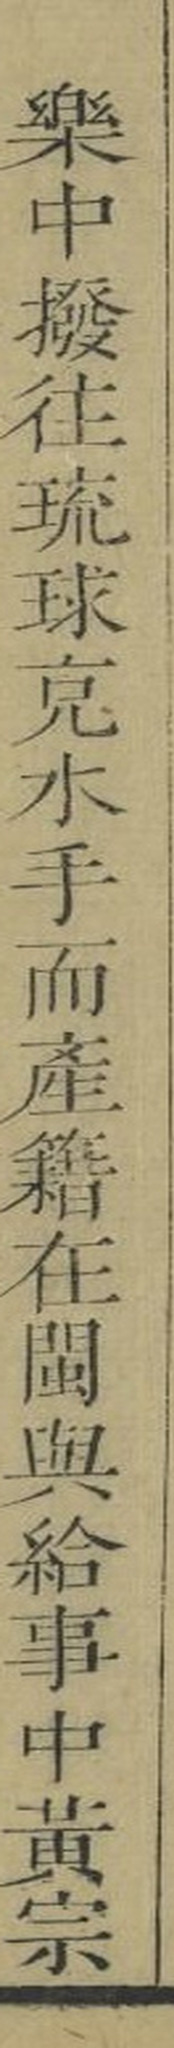楽中撥往琉球克水手而産籍在閩与給事中黄宗
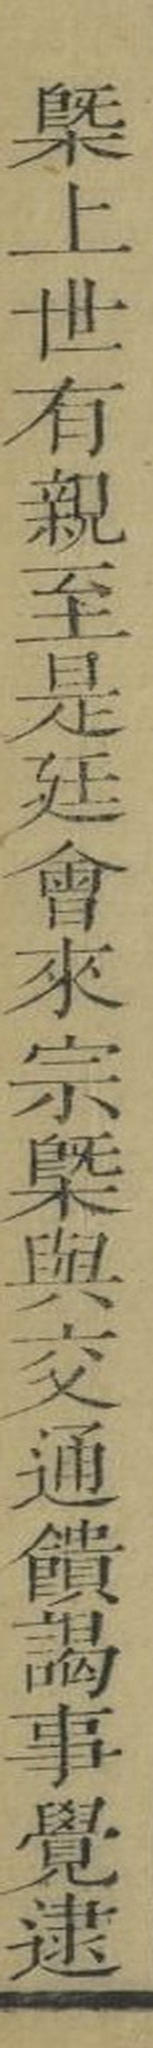概上世有親至是廷会来宗概与交通饋謁事覚逮

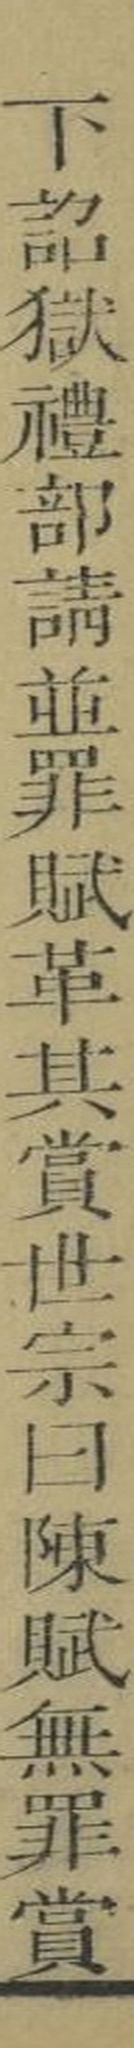下詔獄礼部請並罪賦革其賞世宗曰陳賦無罪賞
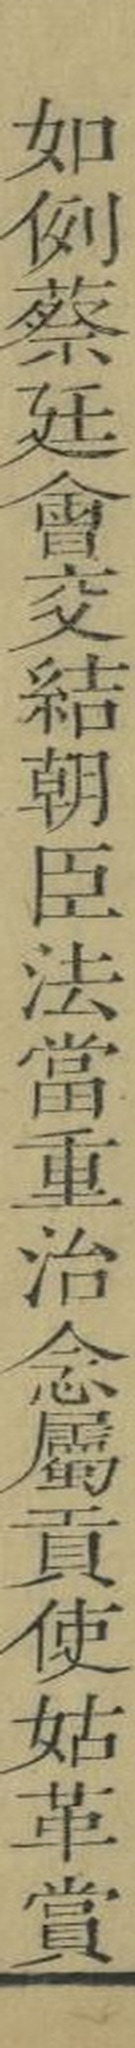如例蔡廷会交結朝臣法当重治念属貢使姑革賞
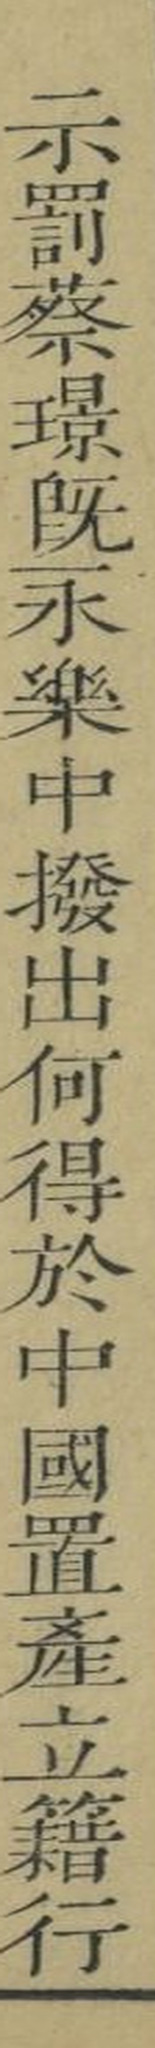示罰蔡璟既永楽中撥出何得於中国置産立籍行
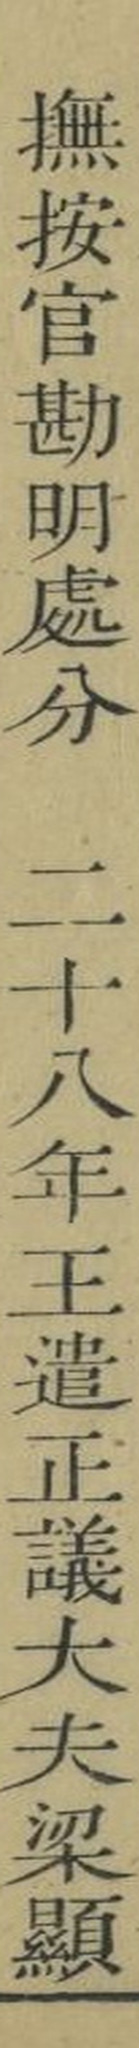撫按官勘明処分二十八年王遣正議大夫梁顕
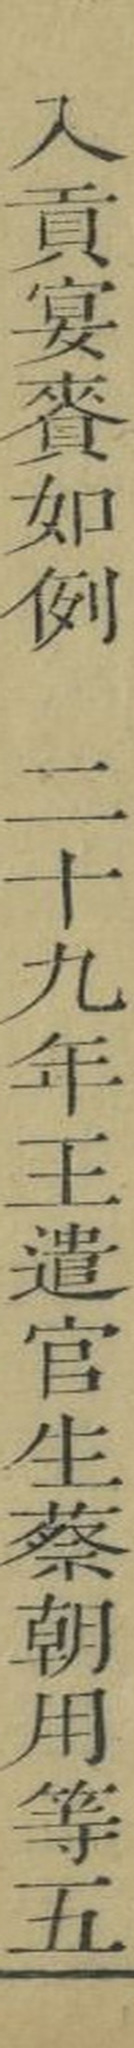入貢宴賚如例二十九年王遣官生蔡朝用等五
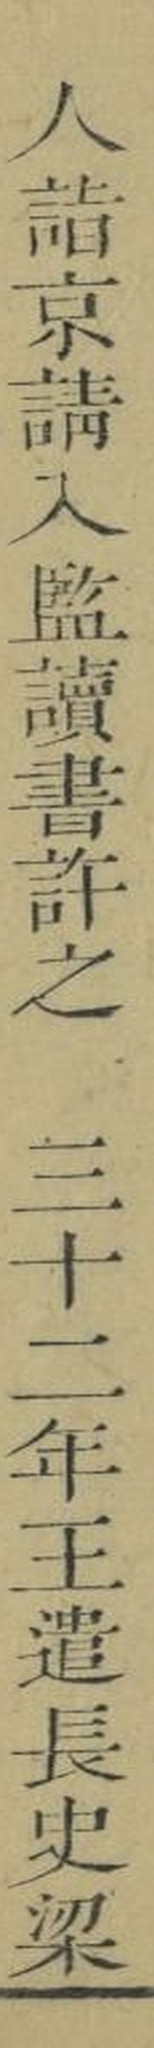人詣京請入監読書許之三十二年王遣長史梁
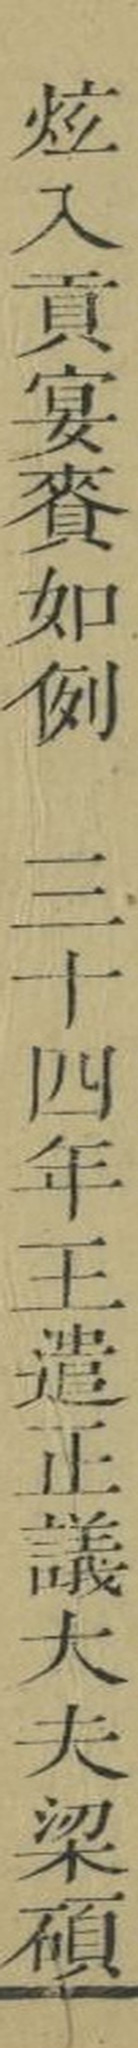炫入貢宴賚如例三十四年王遣正議大夫梁碩
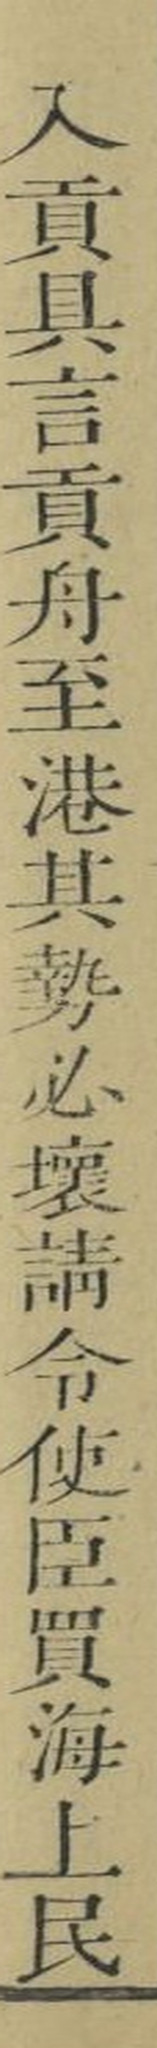入貢具言貢舟至港其勢必壊請令使臣買海上民
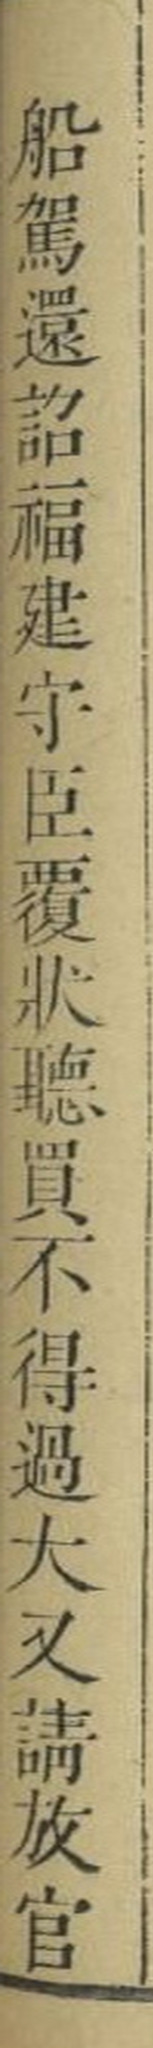船駕還詔福建守臣覆状聴買不得過大又請放官
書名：中山伝信録 巻三
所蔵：University of the Ryukyus Library
